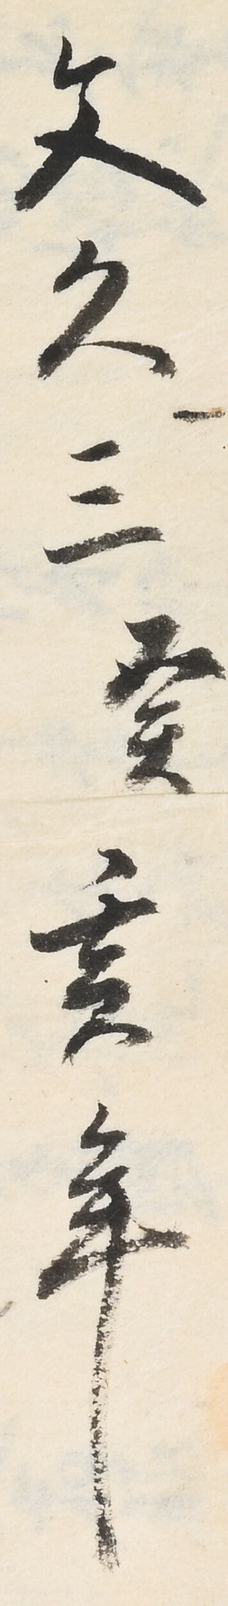㊞文久三癸亥年
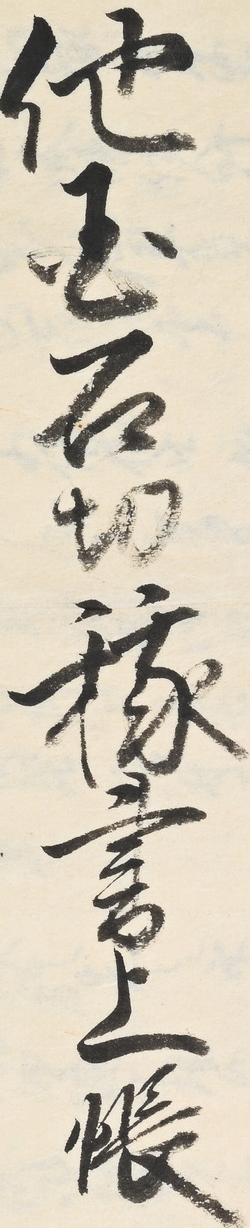他国石切稼書上帳

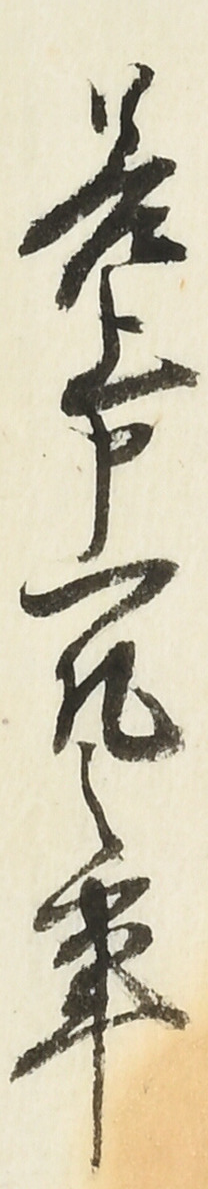差上申一札之事
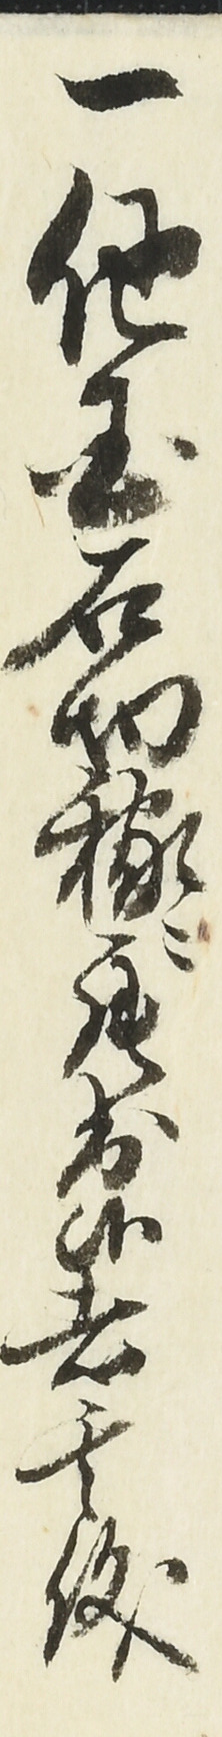一他国石切稼ニ罷出候者其儀
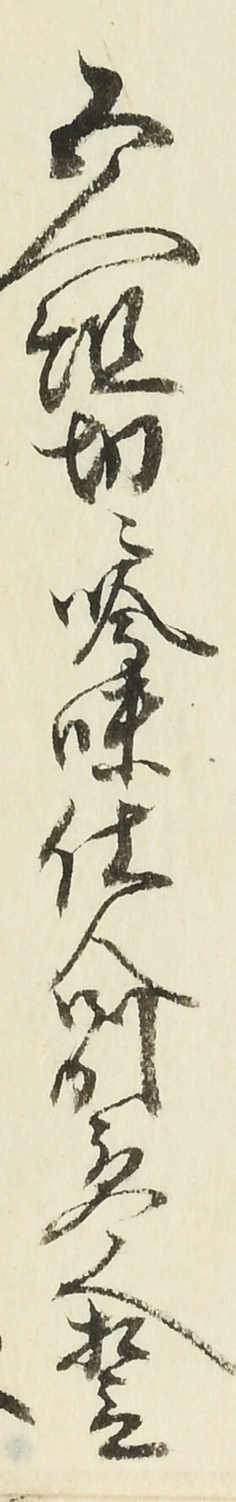五人組切ニ吟味仕人別受人相立
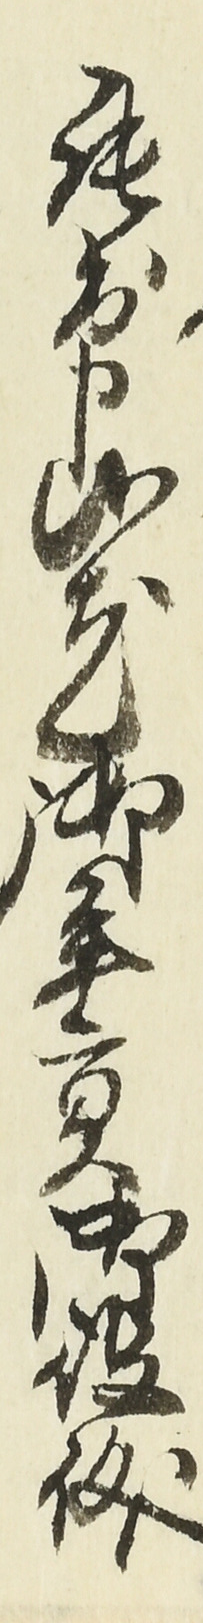罷出申候尤御年貢御役儀
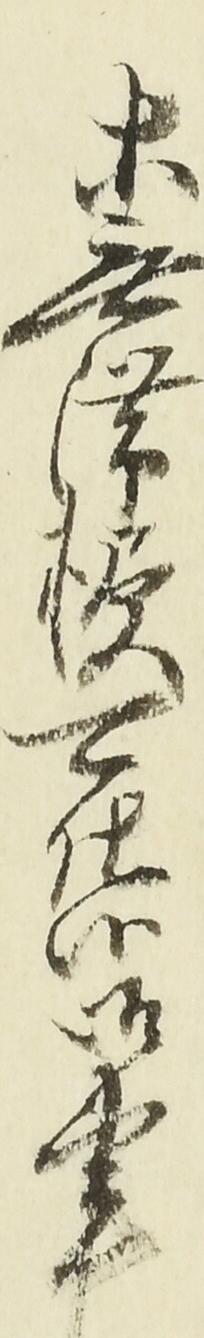等無滞様可仕候御事
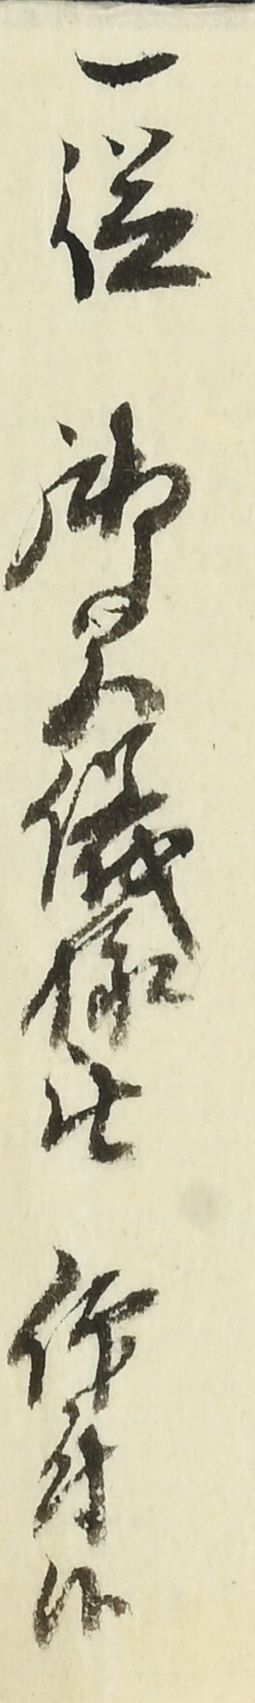一従御公儀様被仰付候
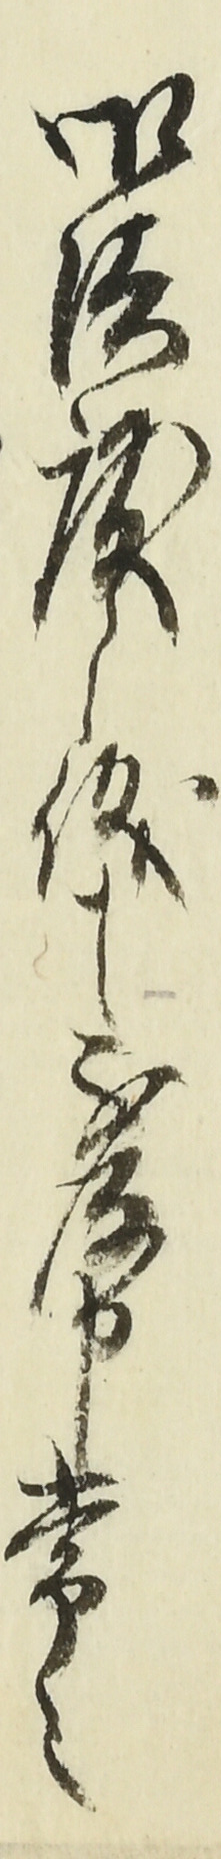御法度之儀者不及申常々
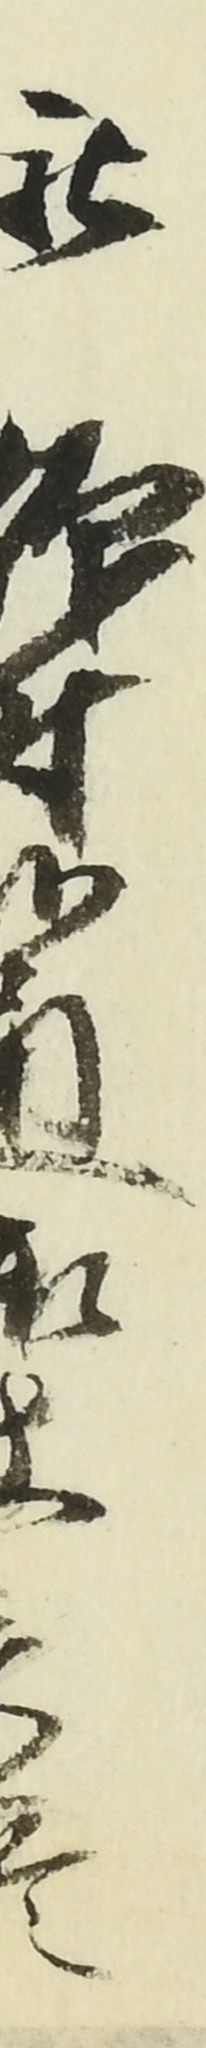被仰付候通御仕置於

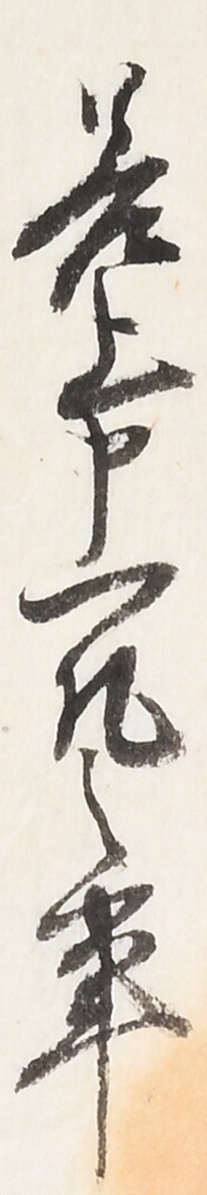差上申一札之事
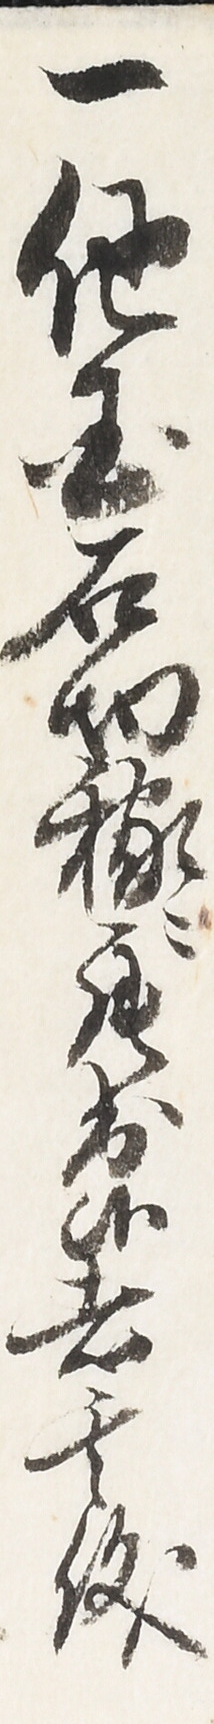一他国石切稼ニ罷出候者其儀
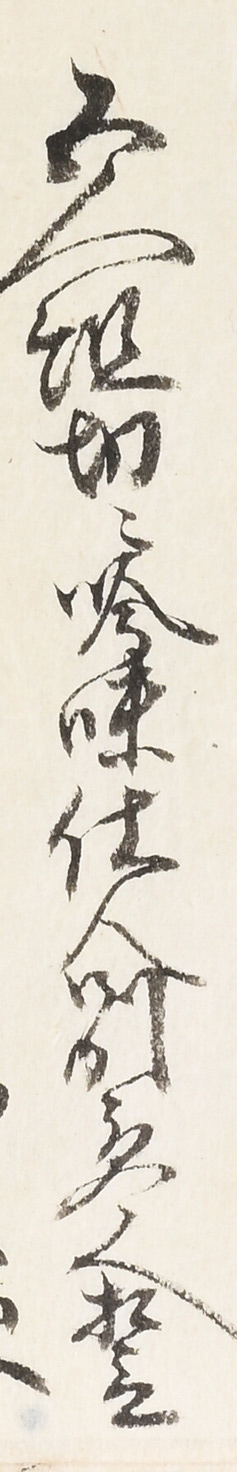五人組切ニ吟味仕人別受人相立
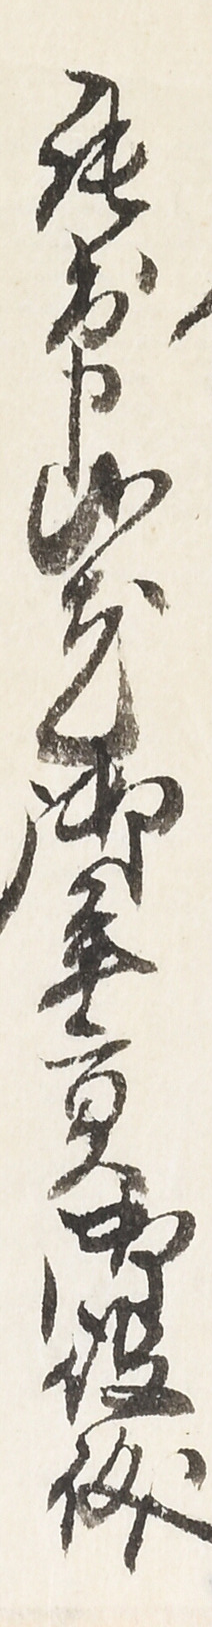罷出申候尤御年貢御役儀
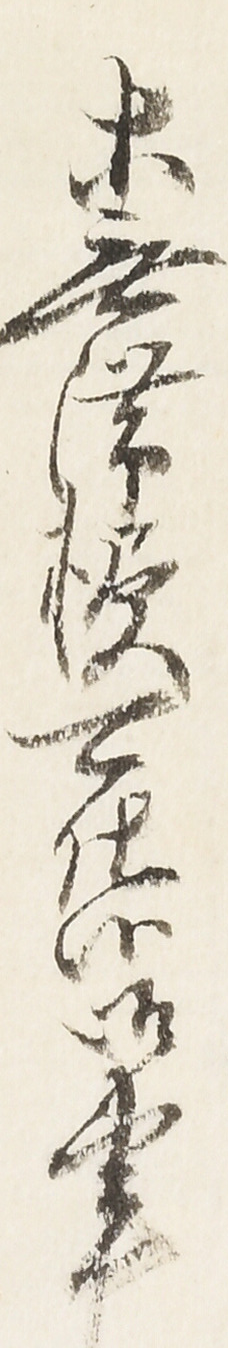等無滞様可仕候御事
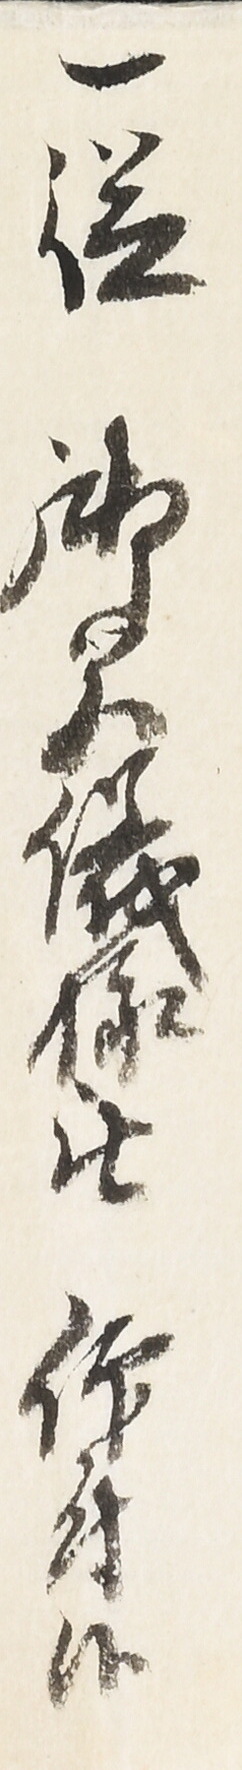一従御公儀様被仰付候
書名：文久三癸亥年二月日他国石切稼書上帳
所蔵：伊那市立高遠町図書館・合同会社AMANE
